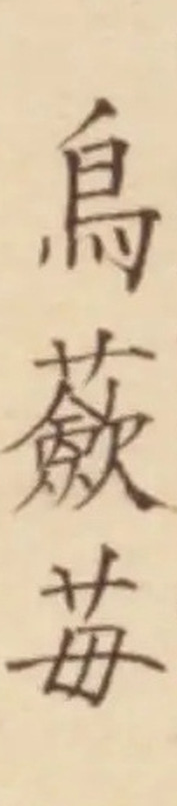烏蘞苺
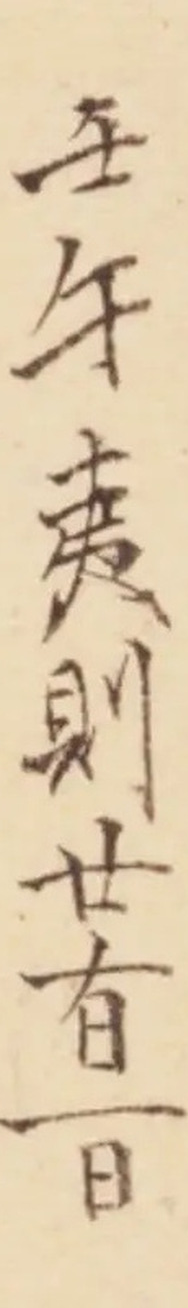壬午夷則廿有一日
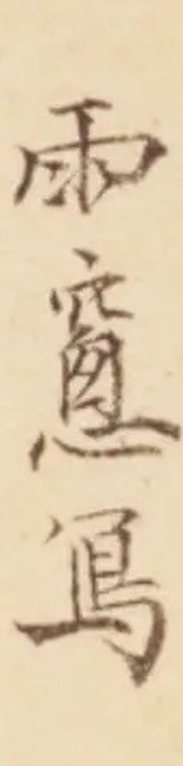雨窓写
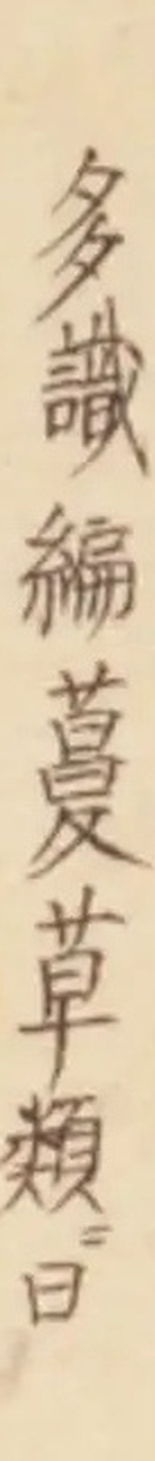多識編草類曰
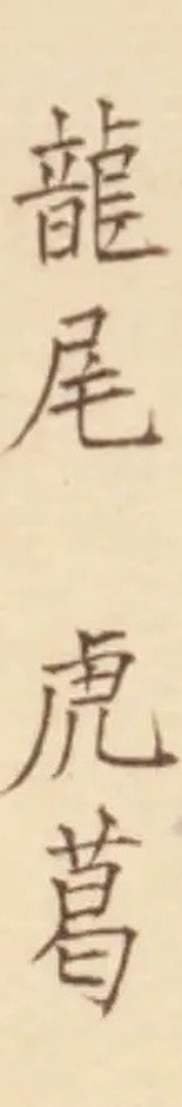竜尾虎葛
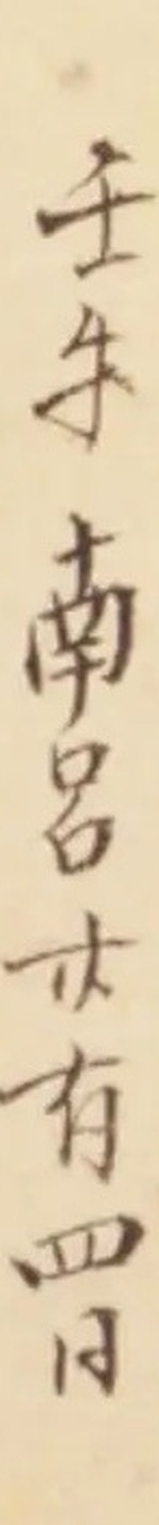壬牛南呂廿有四日
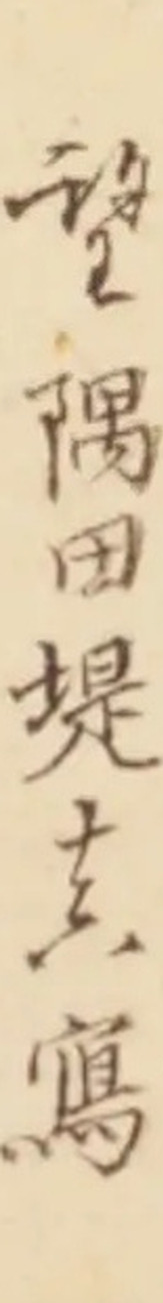望隅田堤真写
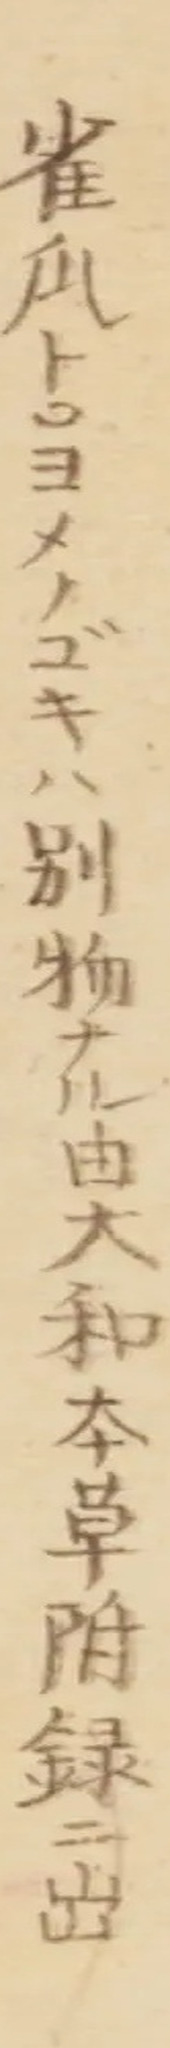雀瓜ト◦ヨメノゴキハ別物ナル由大和本草附録ニ出
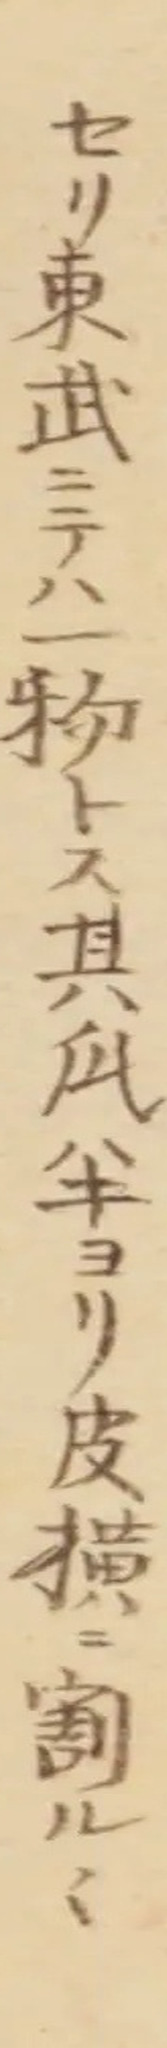セリ東武ニテハ一物トス其瓜半ヨリ皮横割ル〱
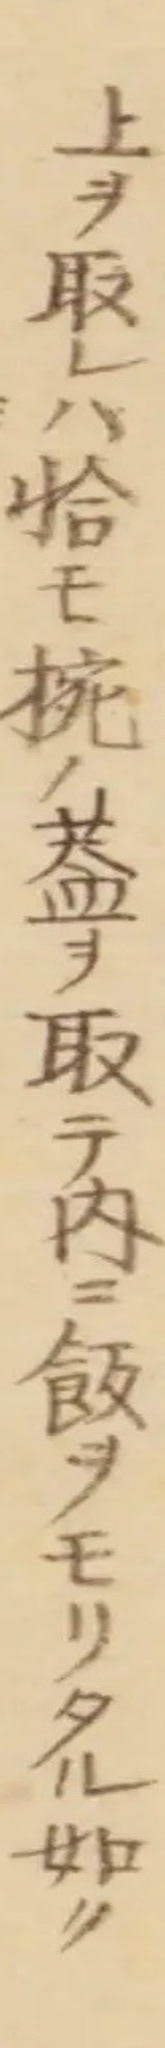上ヲ取レハ恰モ椀ノ蓋ヲ取テ内ニ飯ヲモリタル如ク
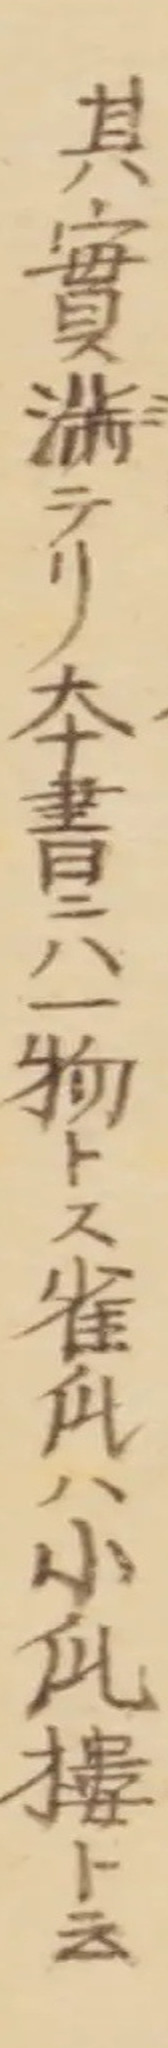其実テリ本書ニハ一物トス雀瓜ハ小瓜楼ト云

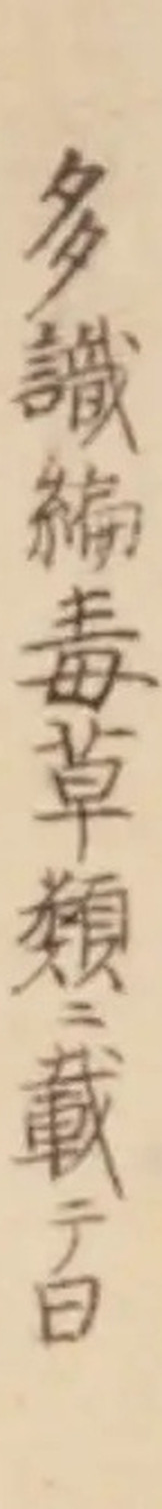多識編毒草類ニ載テ曰
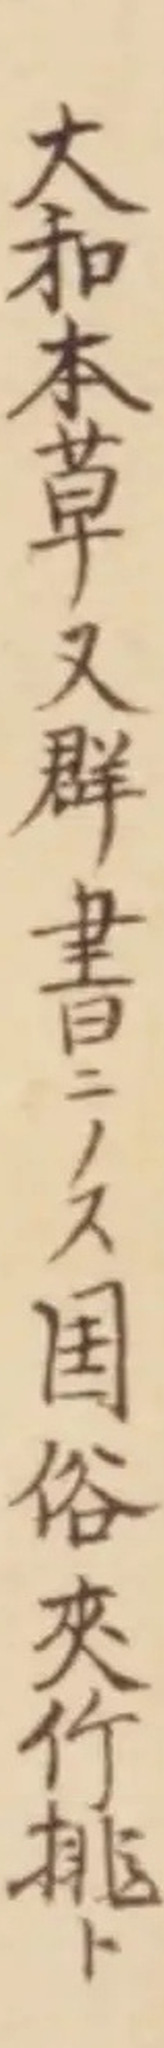大和本草又群書ニノス国俗夾竹桃ト
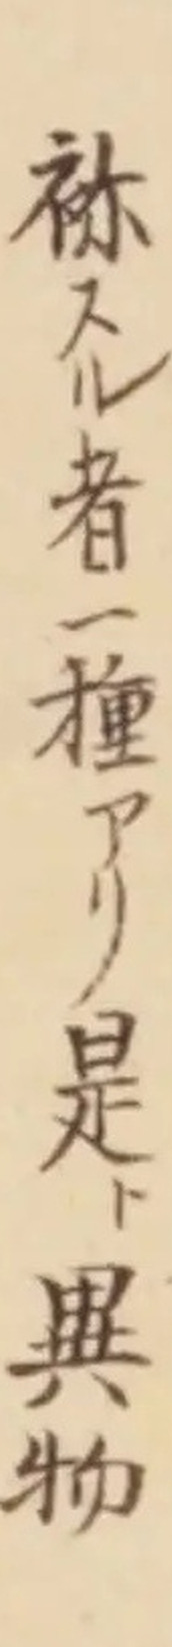袮スル者一種アリ是異物
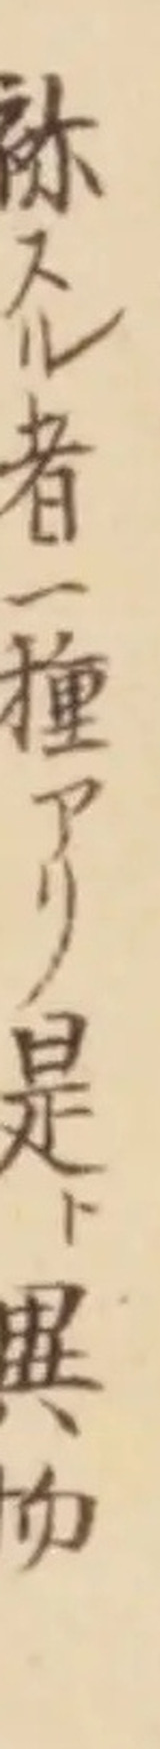袮スル者一種アリ是異物
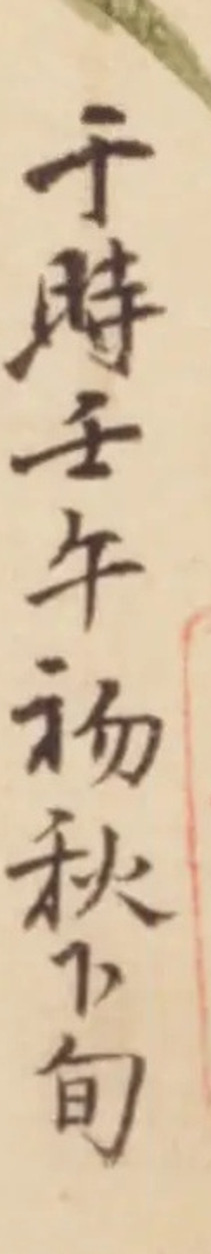于時壬午秋下旬
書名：梅園草木花譜秋之部. 1
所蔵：国立国会図書館 National Diet Library, JAPAN
